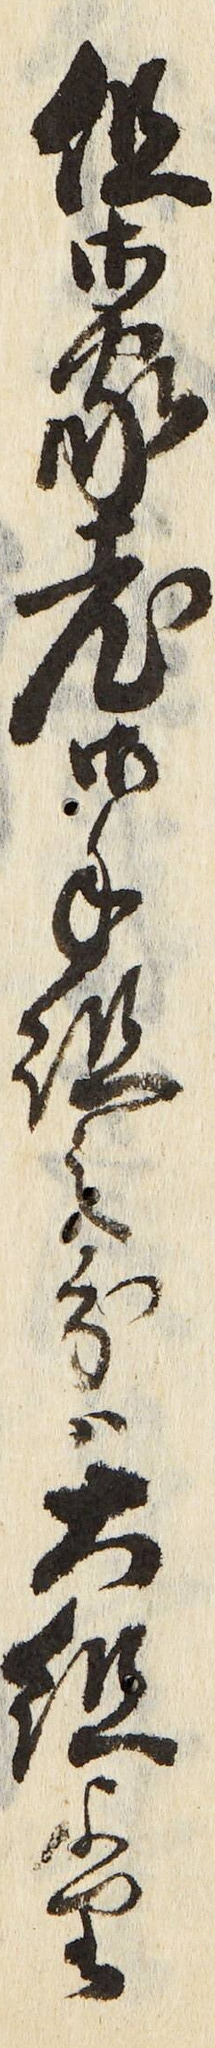但御家老御手組之分ハ大組より
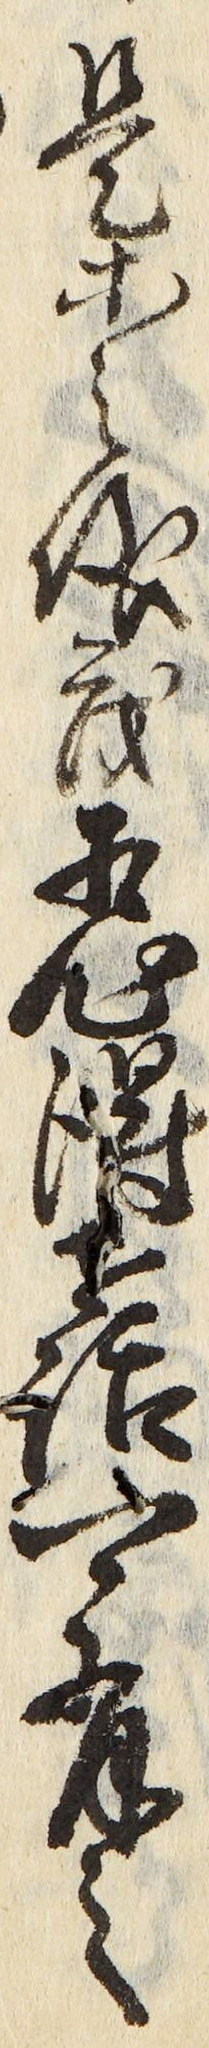是等之儀も相心得世話可有之
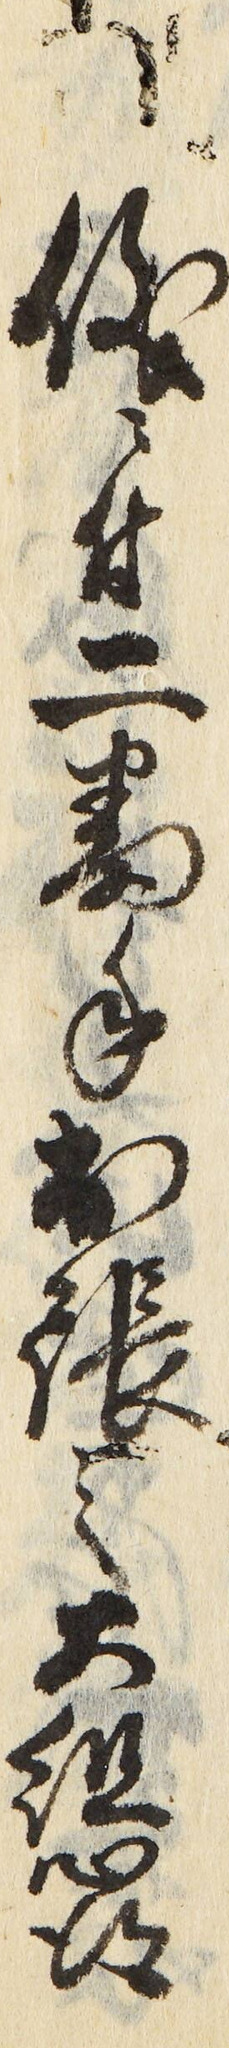儀ニ付二番手出張之大組心得

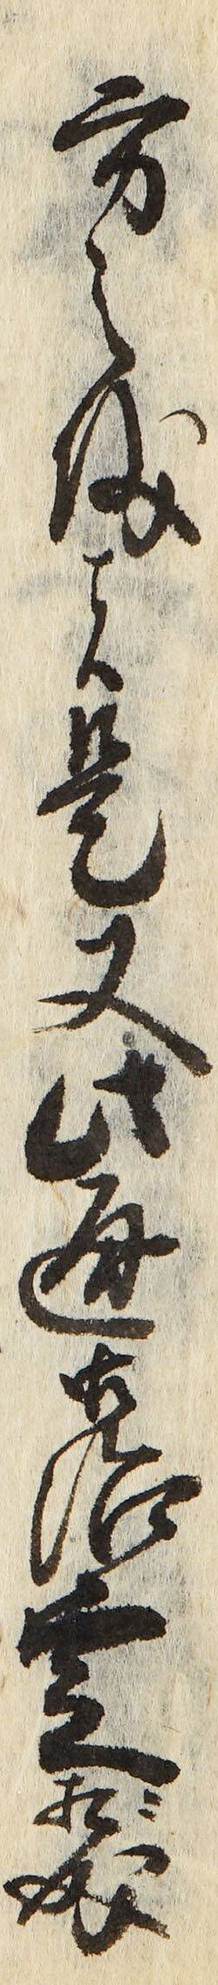方之儀者是又此通御治定ニ相成
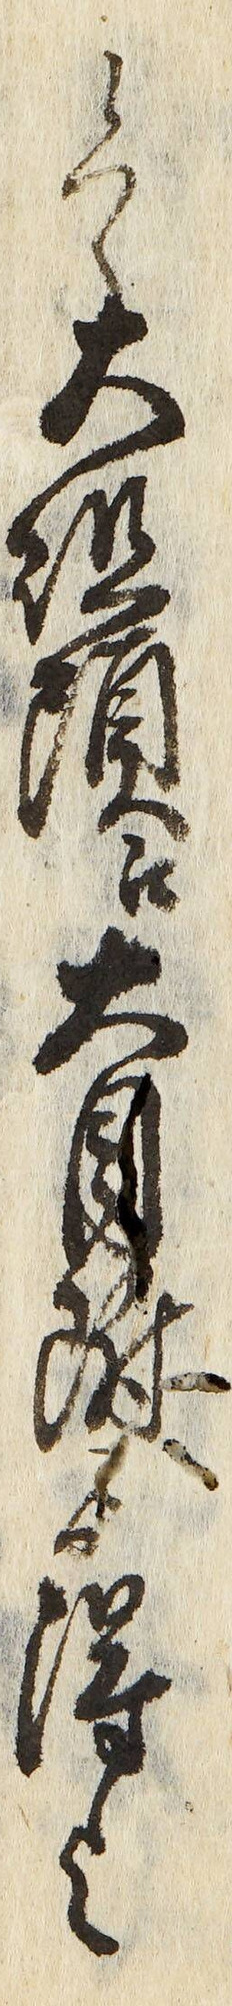候ハヽ大組頭江大目付ゟ得与
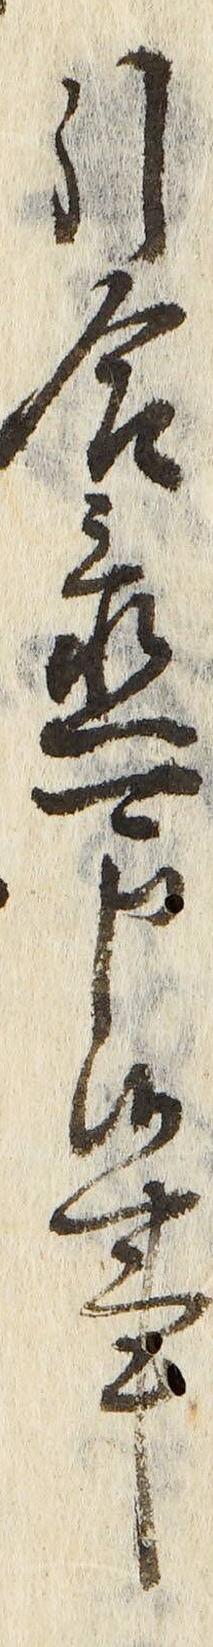引合置可申候事
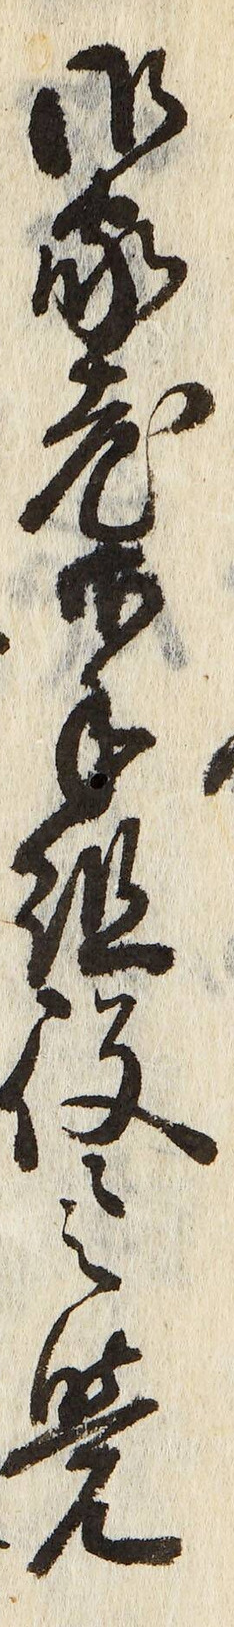御家老御手組役々之覚
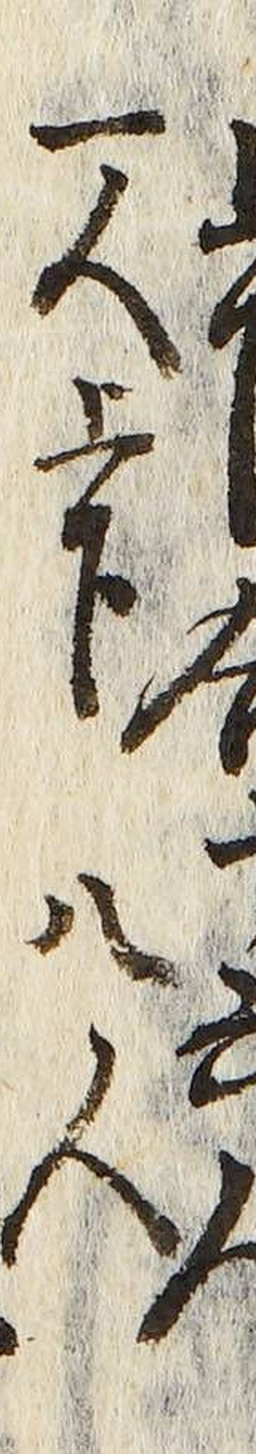一人上下八人
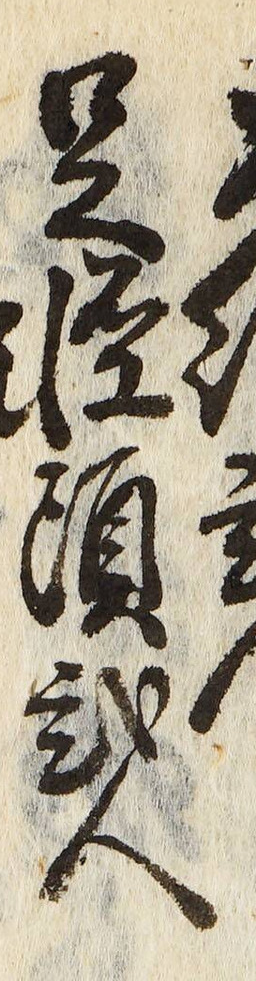足軽五拾人
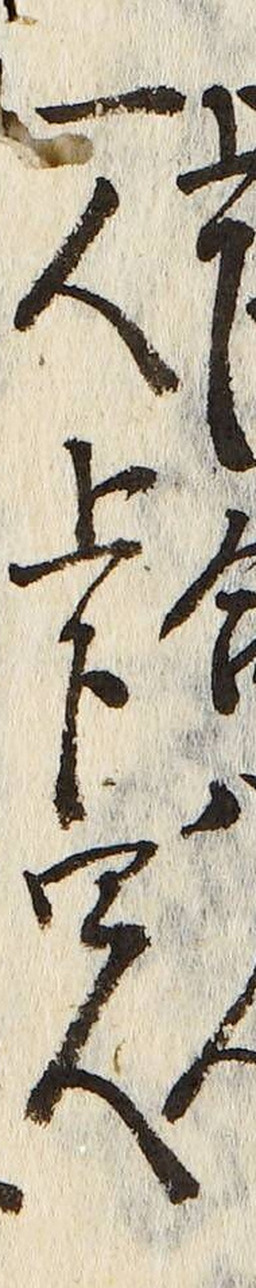一人上下四人
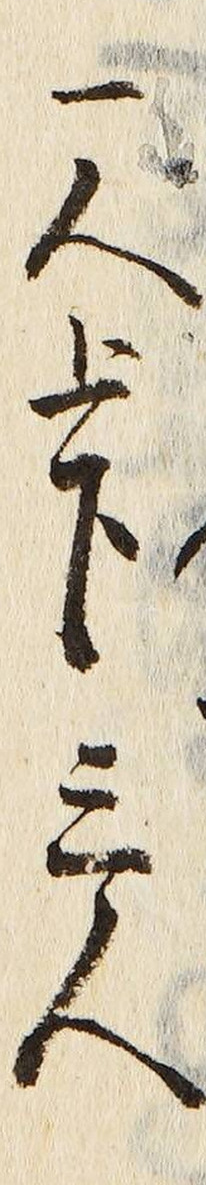一人上下三人
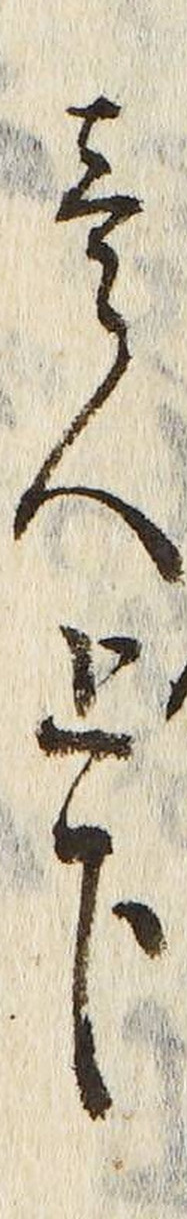壱人上下
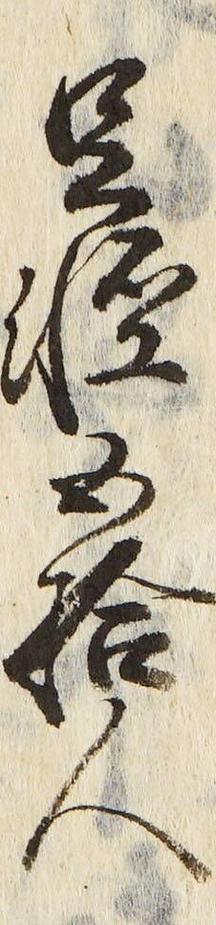足軽五拾人
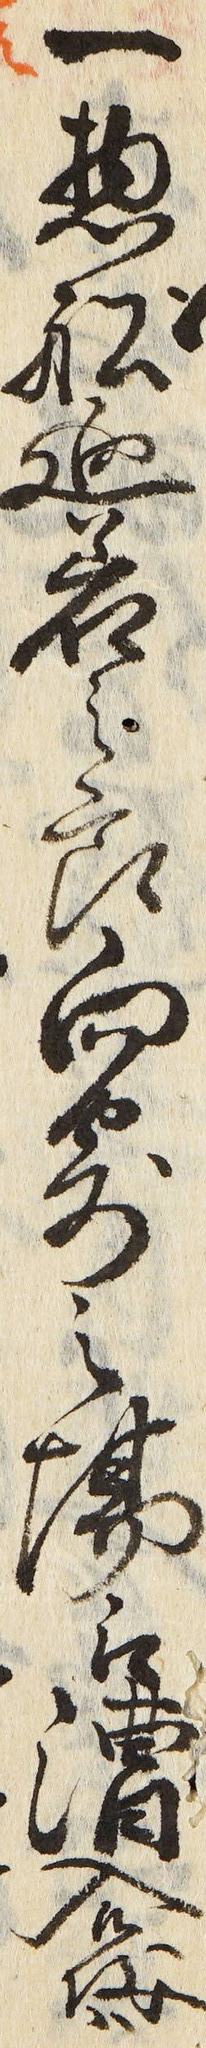一惣船廻着候節向寄之場江漕入候儀ハ
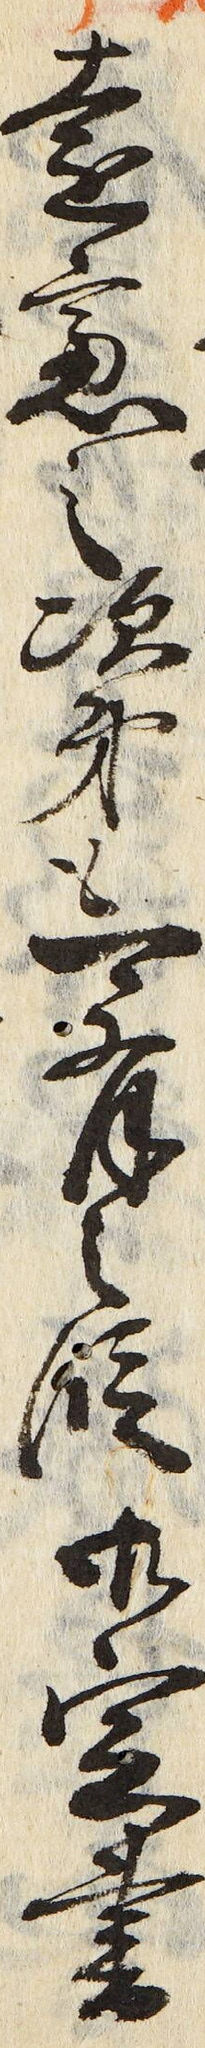遠慮之次第も可有之段御定書
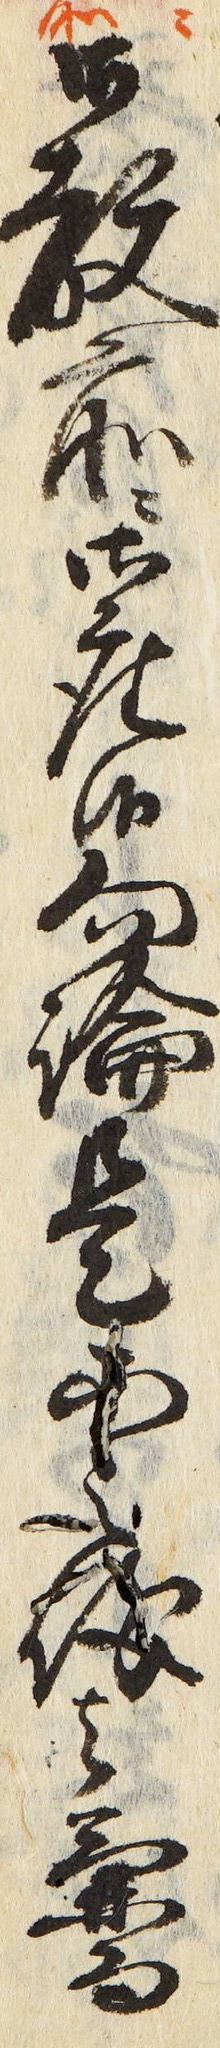御教前ニ御座候勿論是等之儀者兼而
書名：御領海江異国船漂流有之節御手当之次第大組頭心得之廉々書集記
